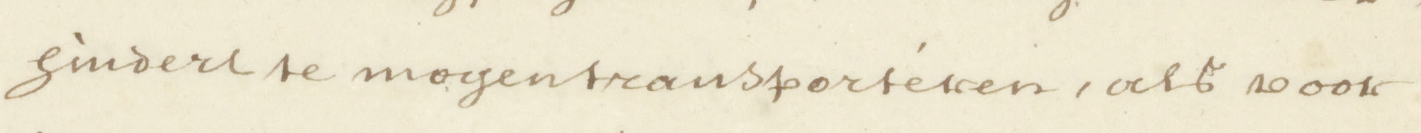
hindert te mogen transporteren, als voor
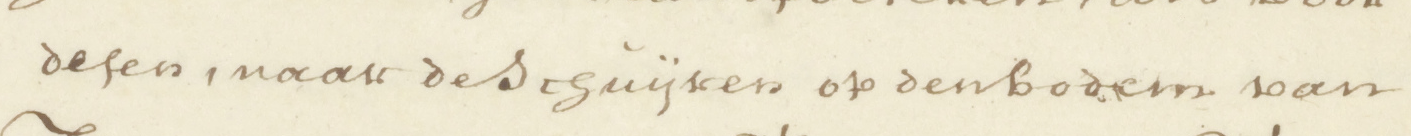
desen, naar de schuijren op den bodem van
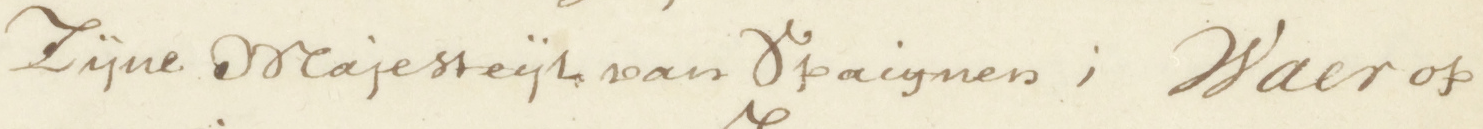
Zijne Majesteijt van Spaignen; Waerop
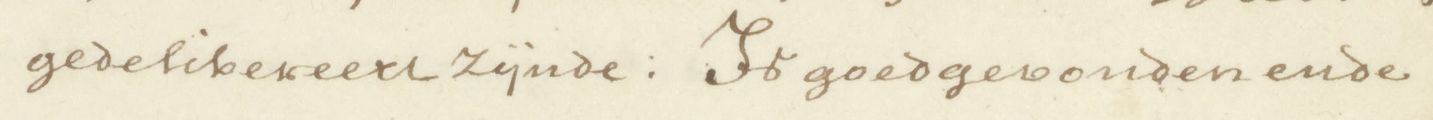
gedelibereert zijnde: Is goedgevonden ende
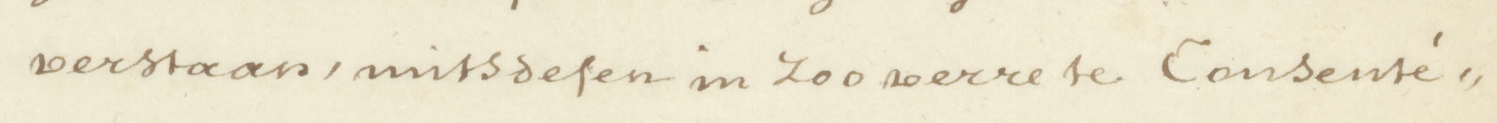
verstaan, mitsdesen in zoo verre te Consente„
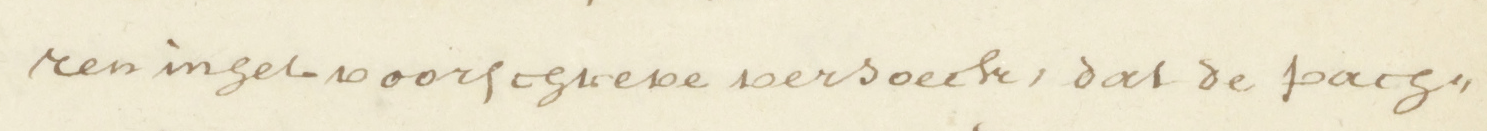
ren in het voorschreve versoeck, dat de pach„
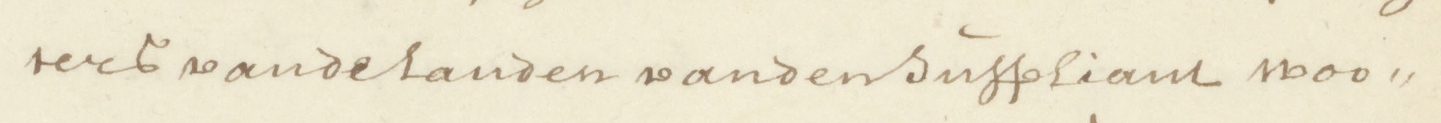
ters vande landen vanden suppliant woo„
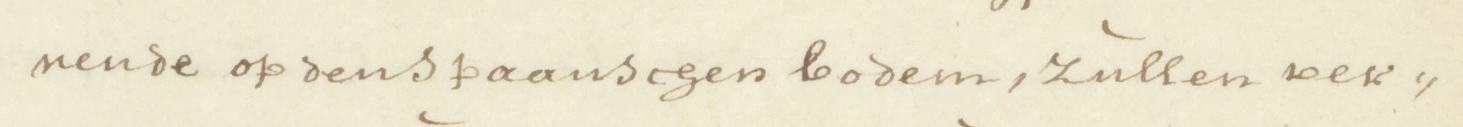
nende op den spaanschen bodem, zullen ver„
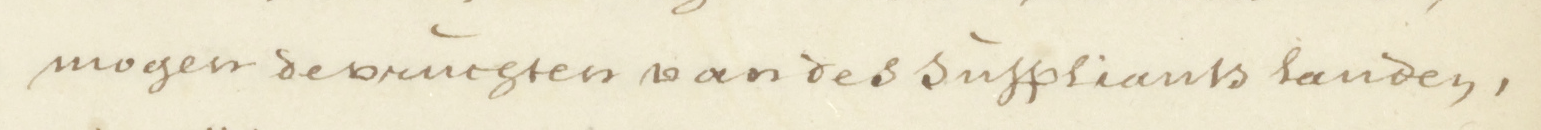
mogen de vruchten van des suppliants landen,
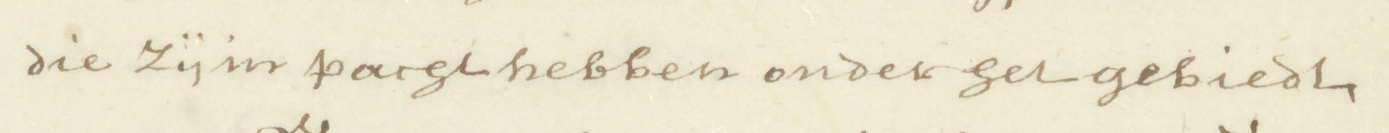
die zij in pacht hebben onder het gebiedt
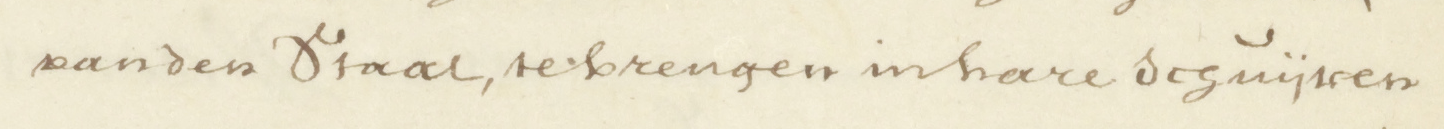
vanden Staat, te brengen in hare schuijren
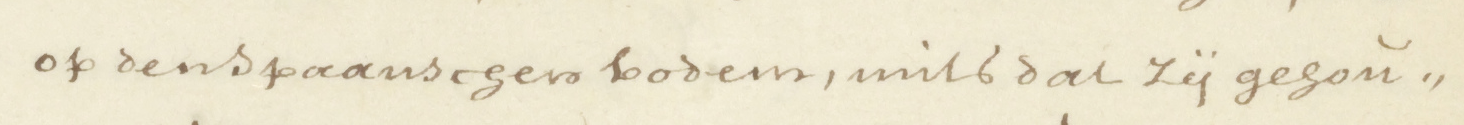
op den spaanschen bodem, mits dat zij gehou„
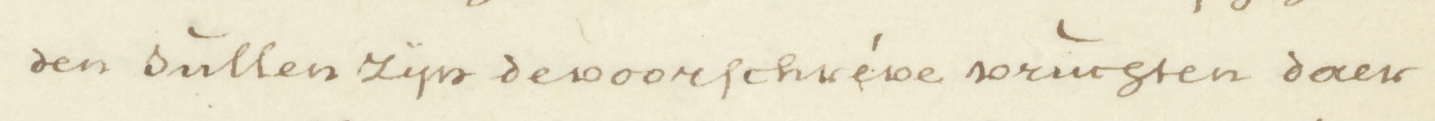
den sullen zijn de voorschreve vruchten daer
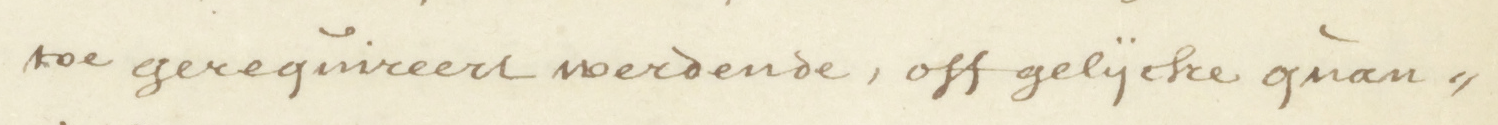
toe gerequireert werdende, off gelijcke quan„
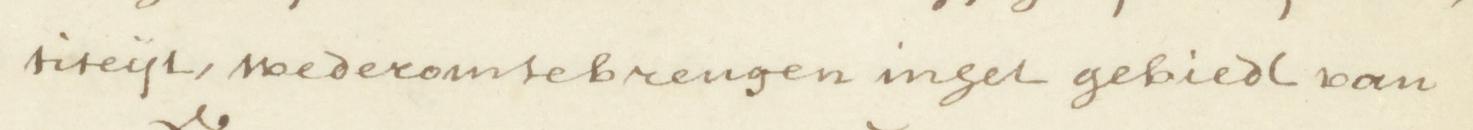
titeijt, wederom te brengen in het gebiedt van
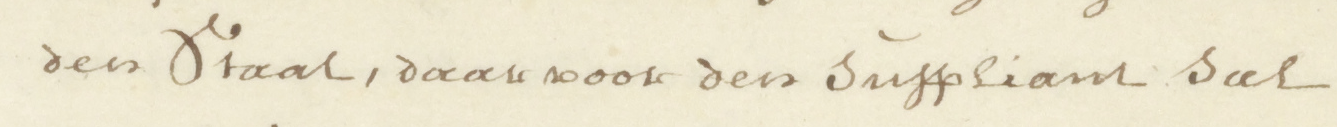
den Staat, daar voor den suppliant sal
